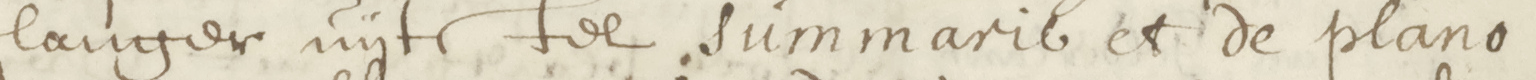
langer uijtstel summaris et de plano
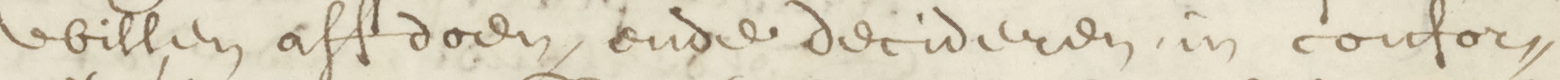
willen affdoen, ende decideren, in confor„
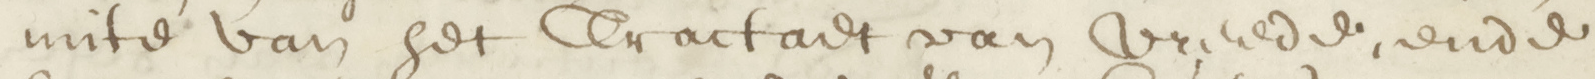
mité van het Tractaet van Vreede, ende
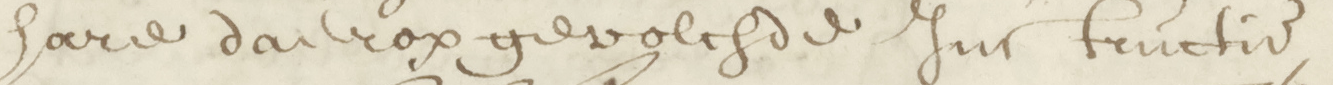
hare daerop gevolchde Instructie.
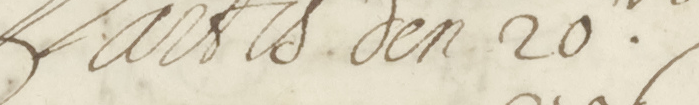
Martis 20en Julij
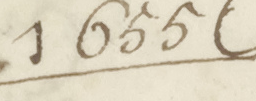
1655
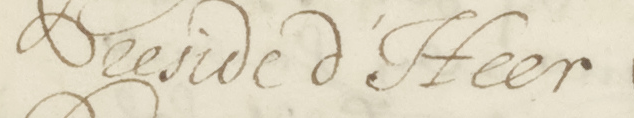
Preside d‛ Heer Veth,
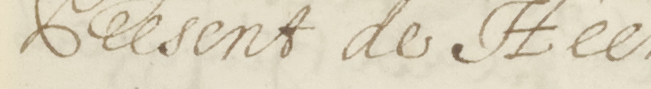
Present de Heeren van Gent.
